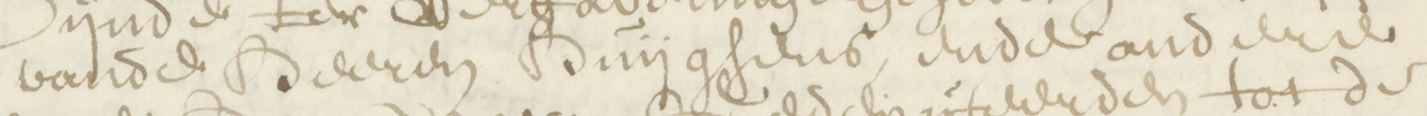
vande Heeren Huijghens ende andere
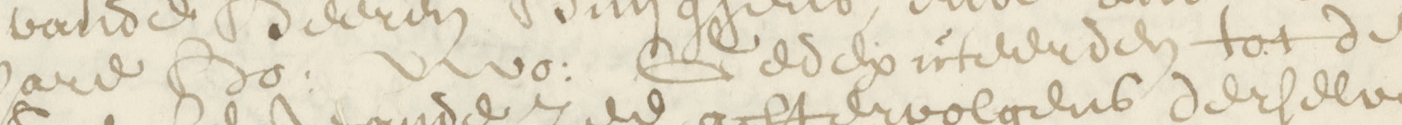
hare Ho:Mo: Gedeputeerden tot de
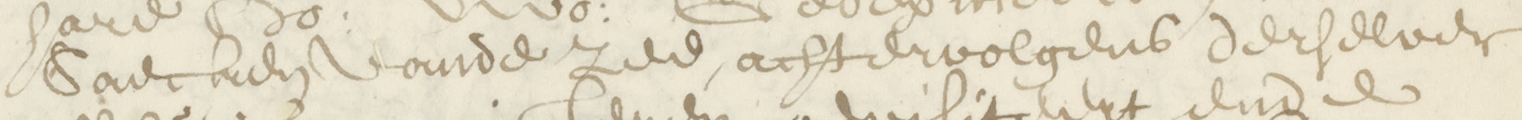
Saecken vande Zee, achtervolgens derselver
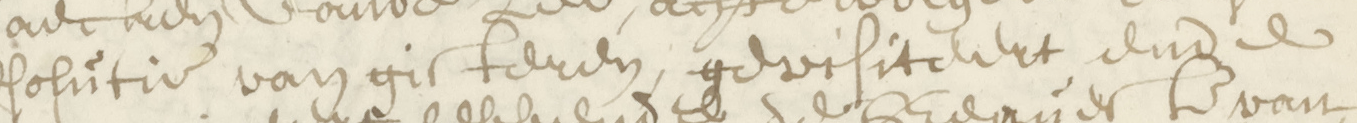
resolutie van gisteren, gevisiteert ende
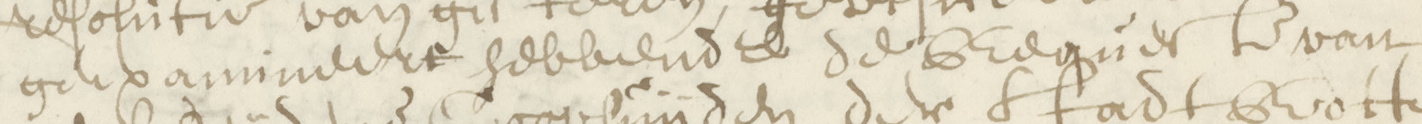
geexamineert hebbende de Requeste van
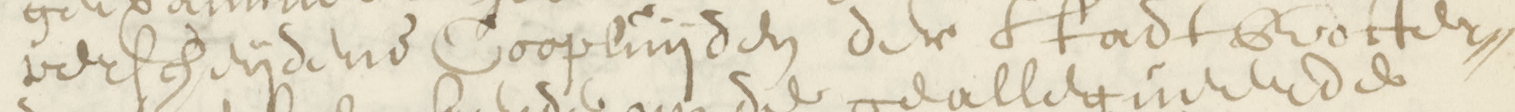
verscheijdene Coopluijden der Stadt Rotter,,
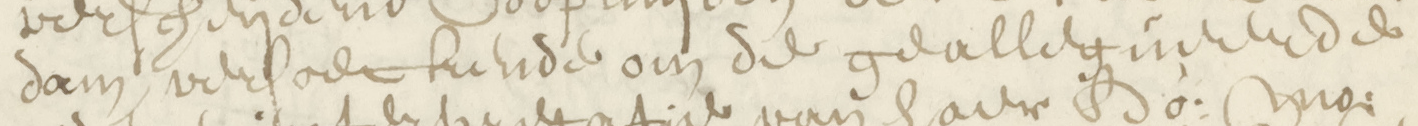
dam, versoeckende om de geallegueerde
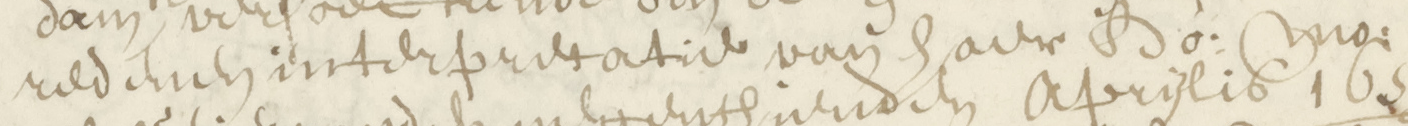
redenen interpretatie van haer Ho:Mo:
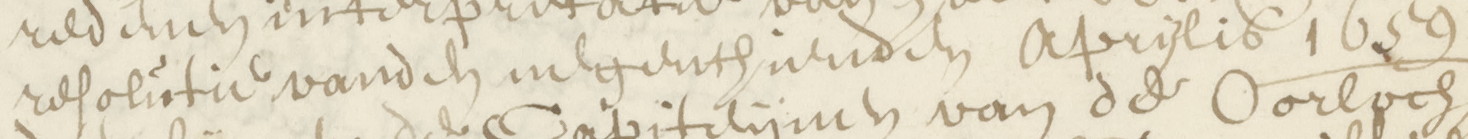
resolutie vanden negenthienden Aprilis 1659
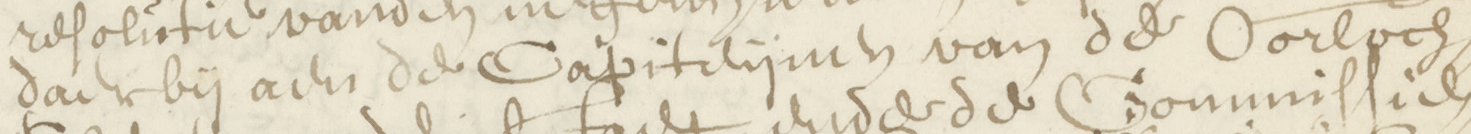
daerbij aen de Capiteijnen van de Oorloch,,
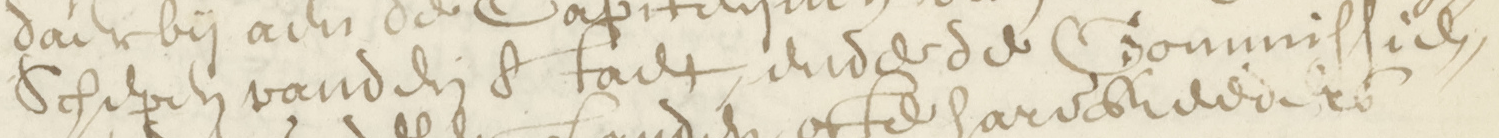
Schepen vanden Staet, ende de Commissie,,
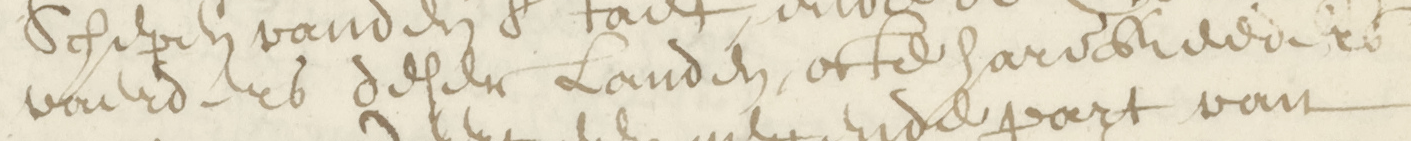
vaerders deser Landen, ofte hare Reeders
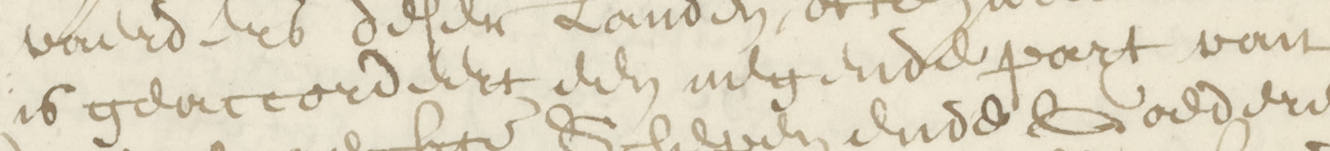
is geaccordeert een negende part van
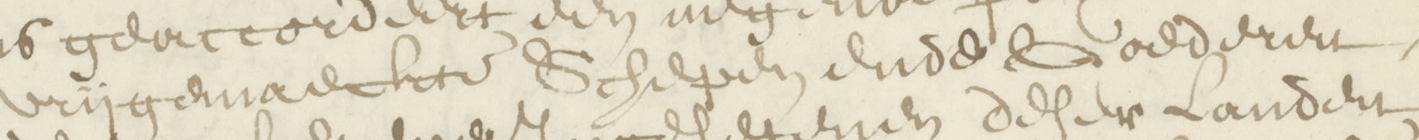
vrijgemaeckte Schepen ende Goederen,
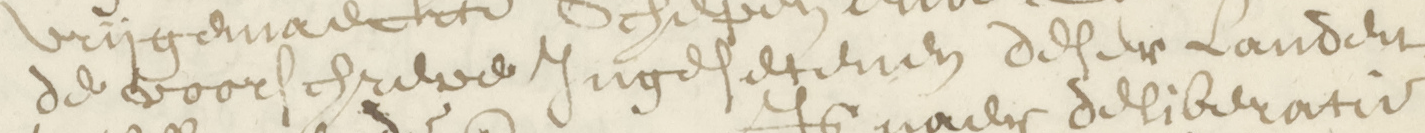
de voorschreve Ingesetenen deser Landen
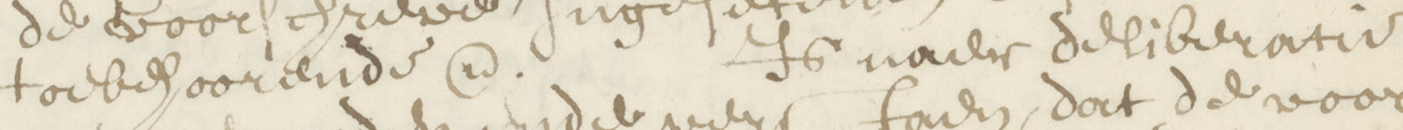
toebehoorende @. Is naer deliberatie
